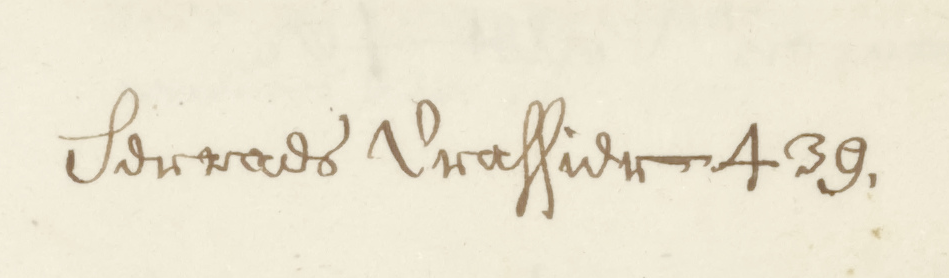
Servaes Crassier 439.
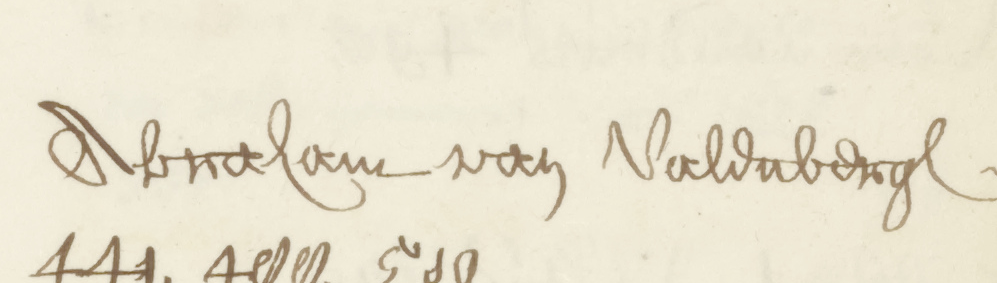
Abraham van Calenbergh
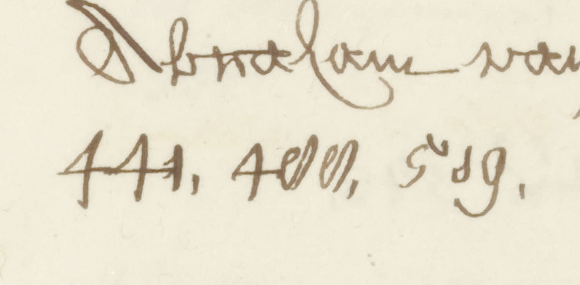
441, 488, 509.
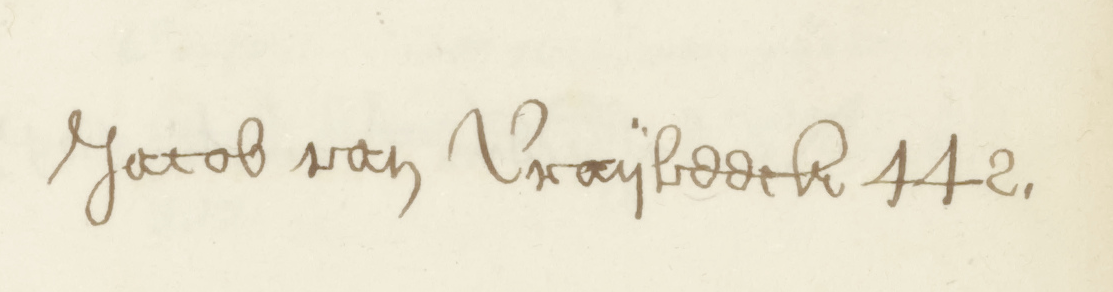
Jacob van Craijbeeck 442.
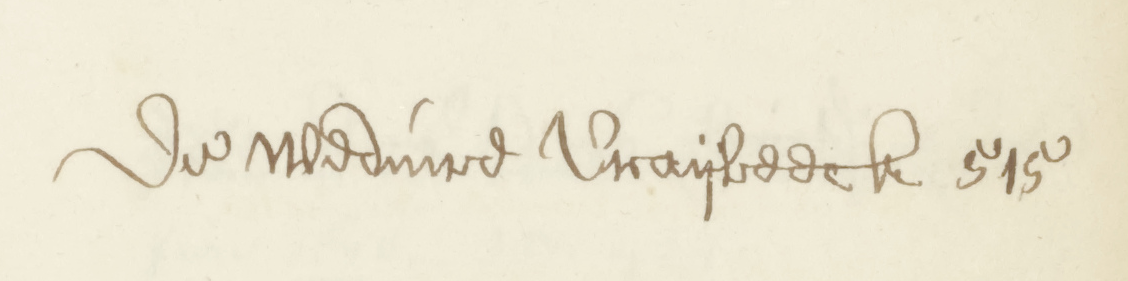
De Weduwe Craijbeeck 515
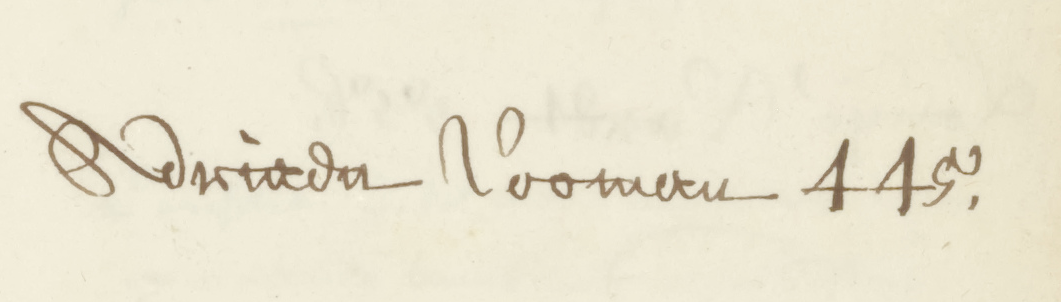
Adriaen Cooman 445.
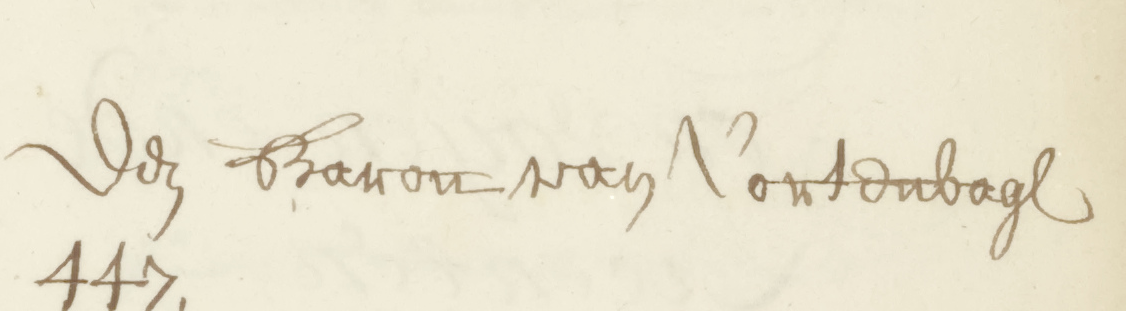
Den Baron van Cortenbagh
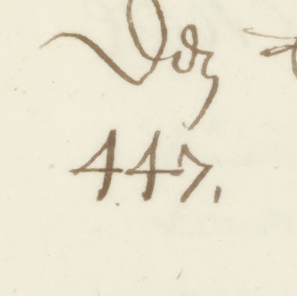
447.
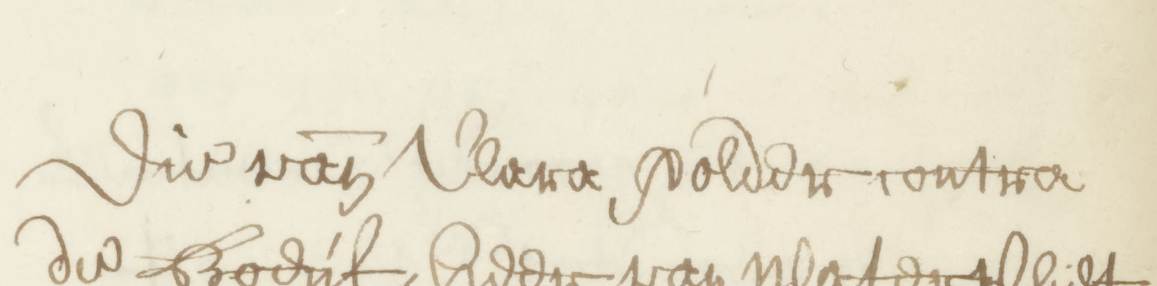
Die van Clara Polder contra
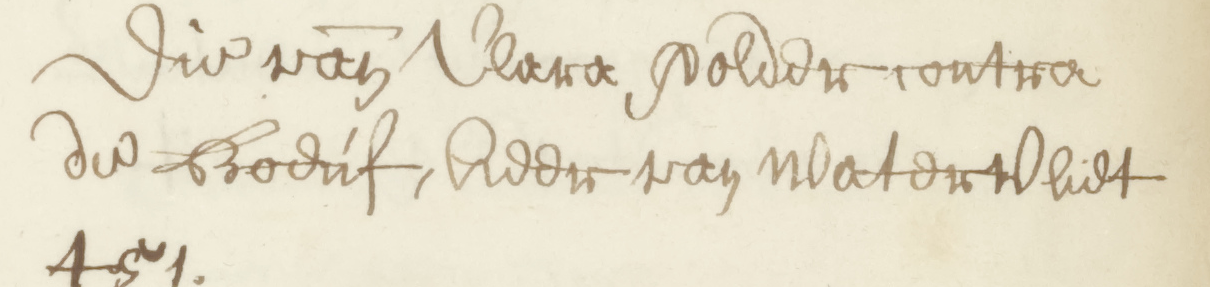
de Boeuf, heer van van Watervliet
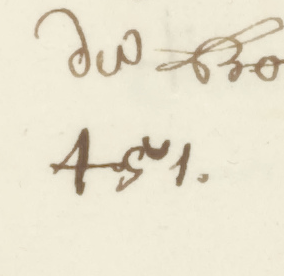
451.
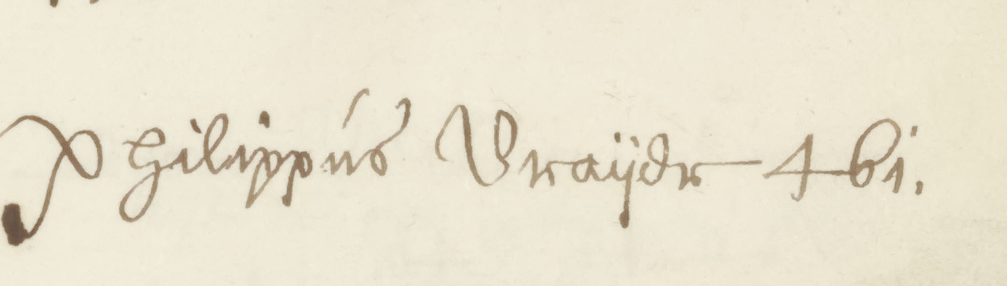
Philippus Craijer 461.
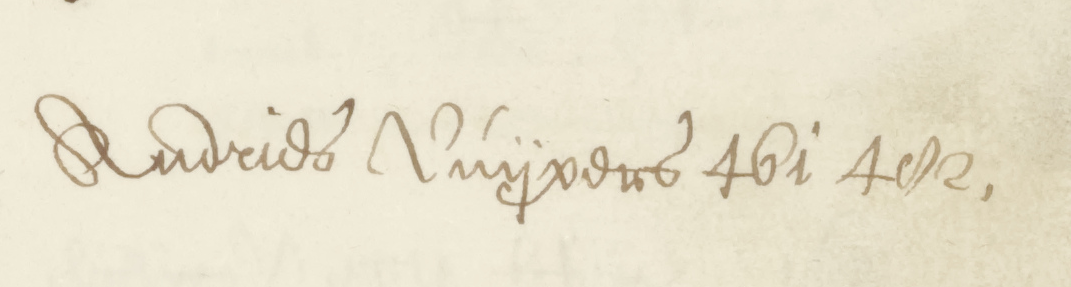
Andries Cuijpers 461 482.
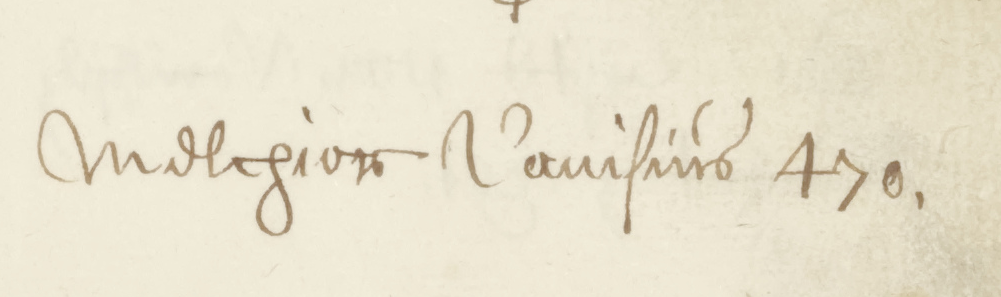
Melchior Canisius 470.
